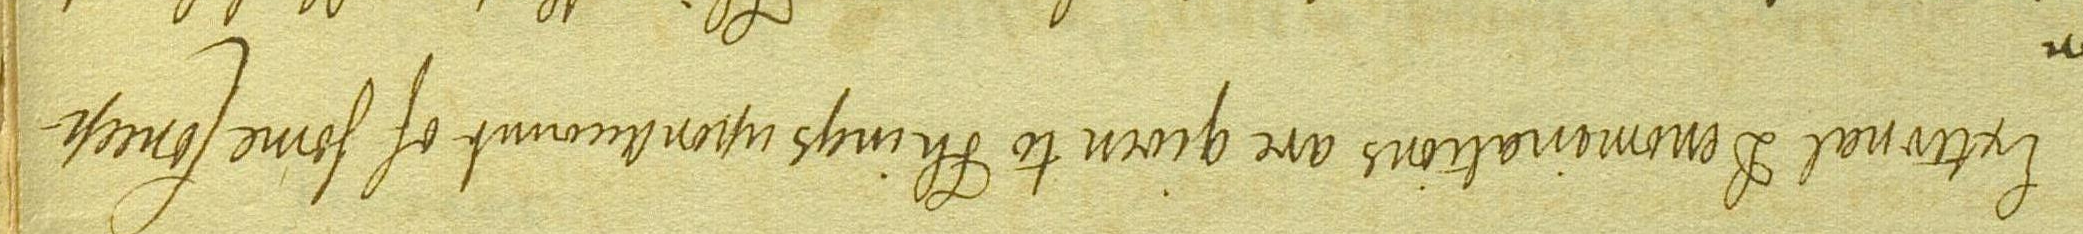External Denominations are given to Things upon Account of some Concep-
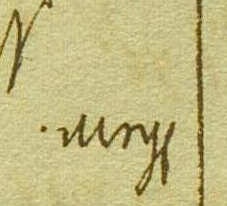them.
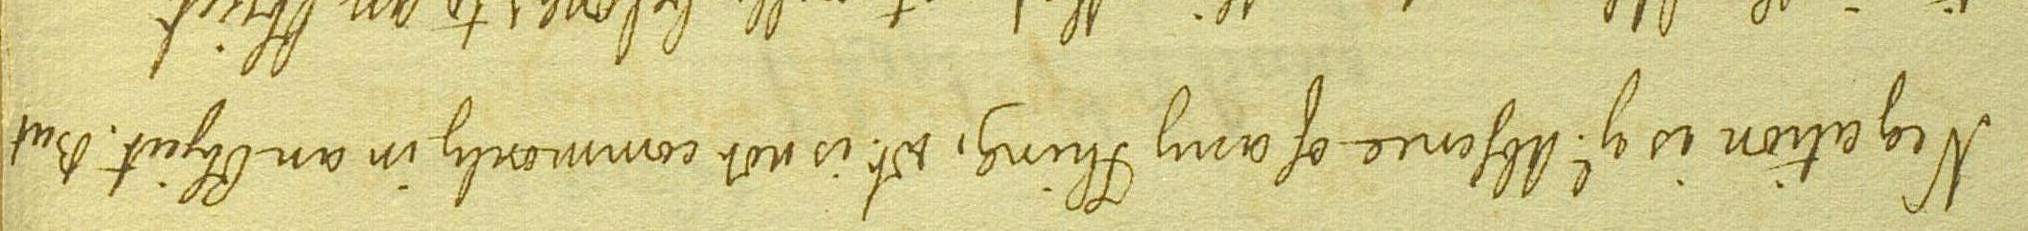Negation is y^e. Absence of any Thing, w^h is not commonly in an Object. But
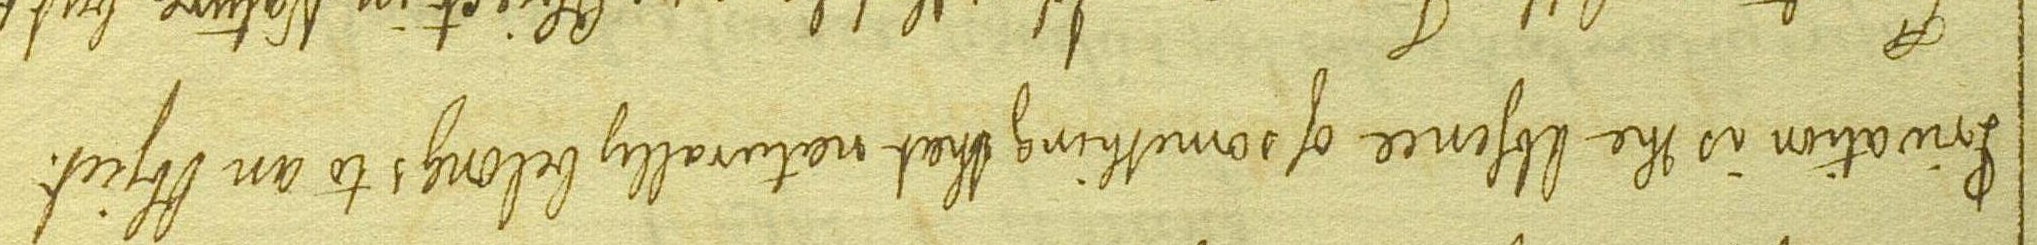Privation it the Absence of something that naturally belongs to an Object.
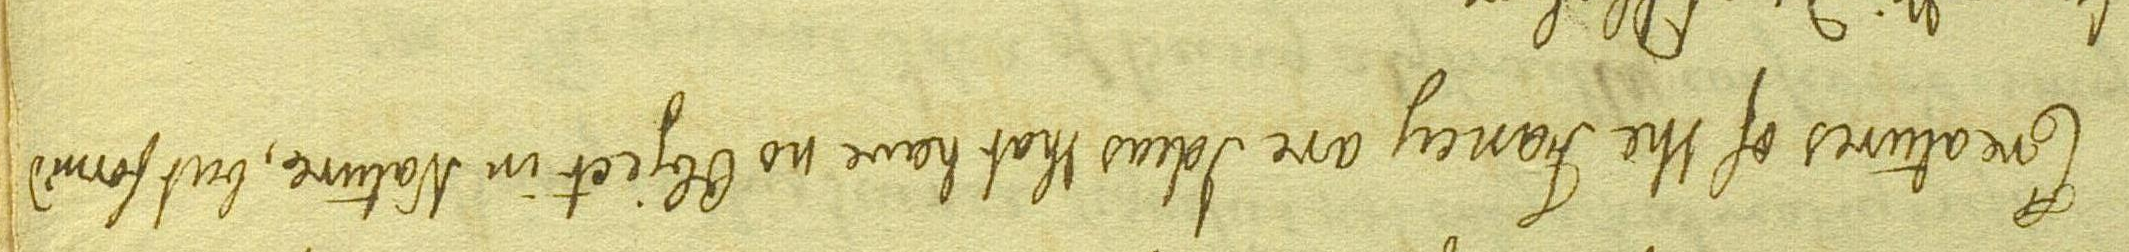Creatures of the Fancy are Ideas that have no Object in Nature, but form'd
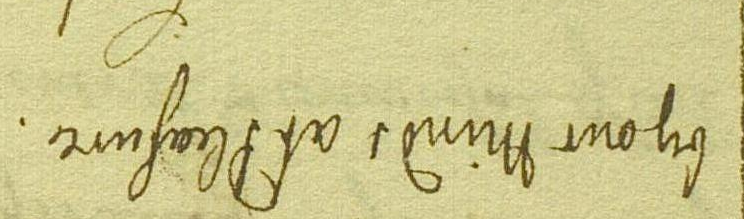by our Minds at Pleasure.
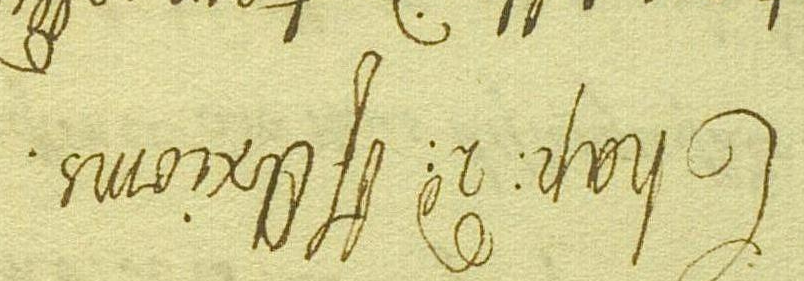Chap: 2^d: Of Axioms.
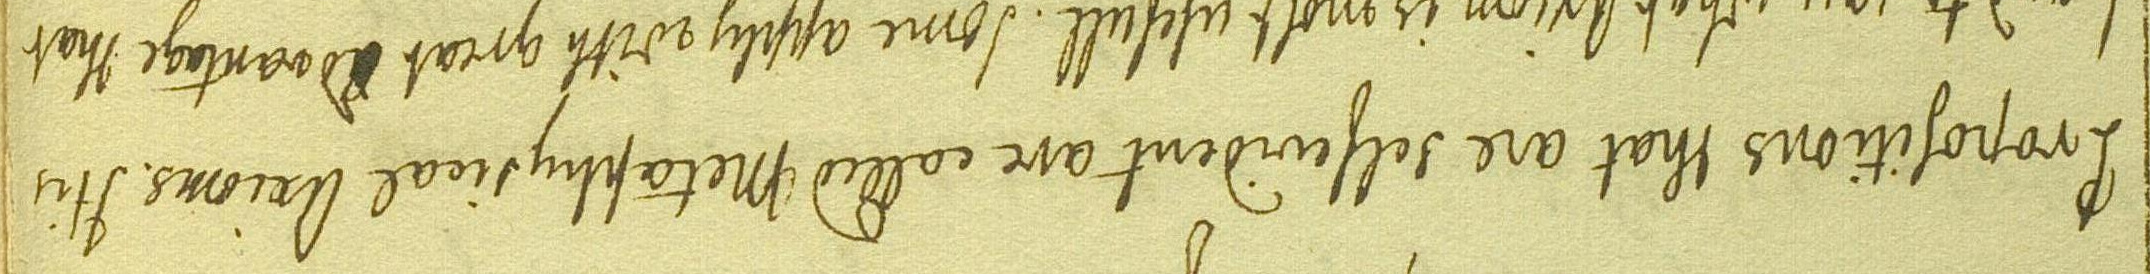Propositions that are self evident are called Metaphysical Axioms. It is
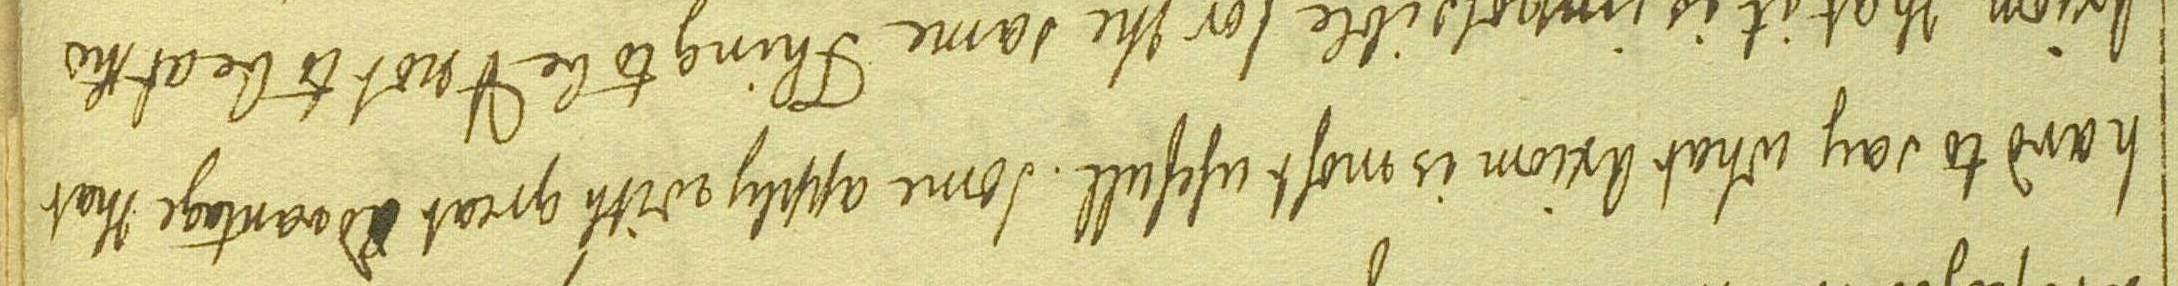hard to say what Axiom is most usefull. Some apply with great advantage that
